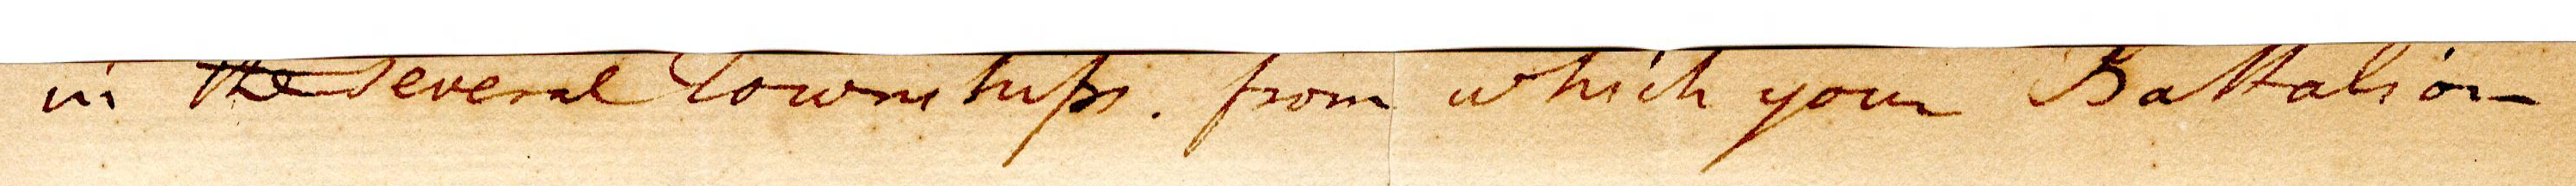in the several townships from which your Battalion
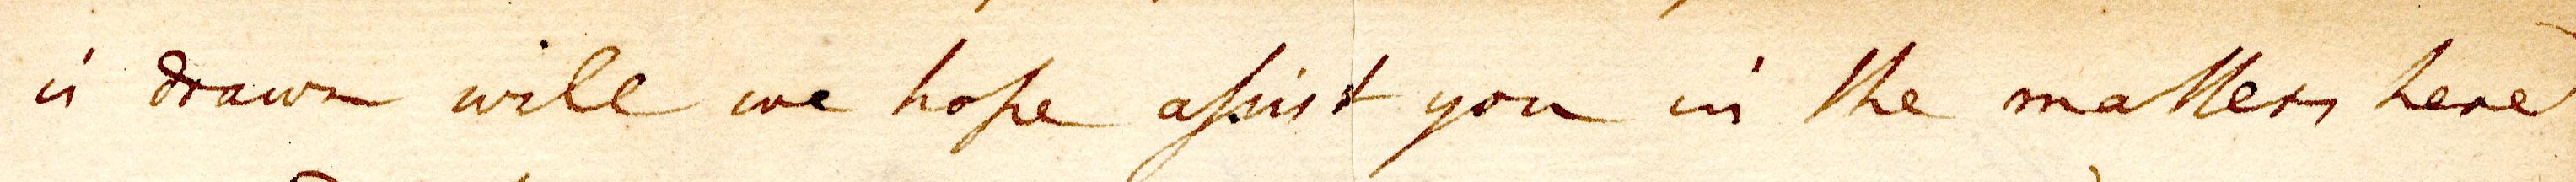is drawn will we hope assist you in the matter here
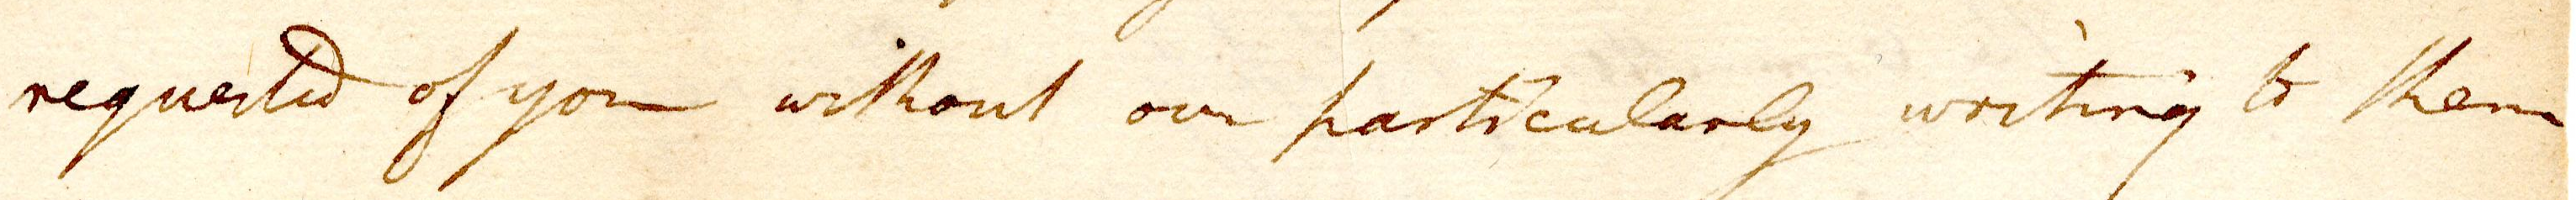requested of you without our particularly writing to them.
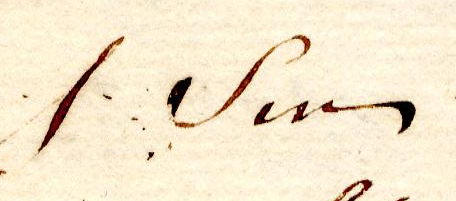I Sir
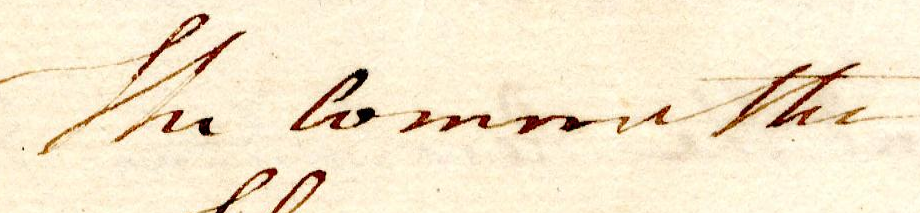The committee
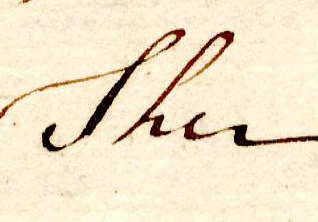Sher
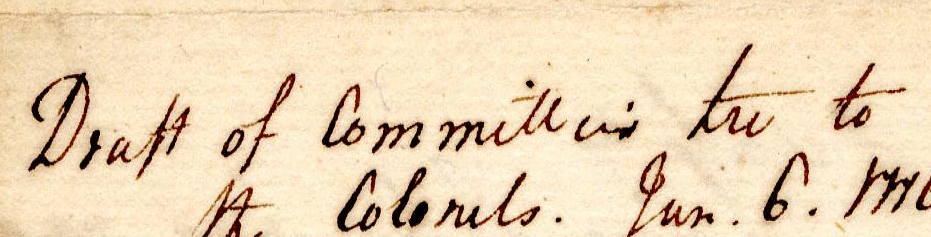Draft of Committee's tre to
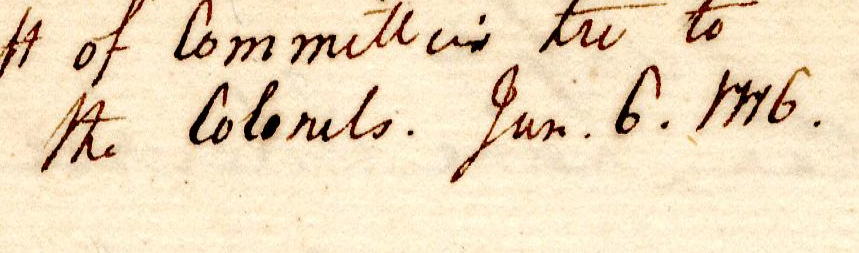the Colonels. Jun. 6. 1776.
